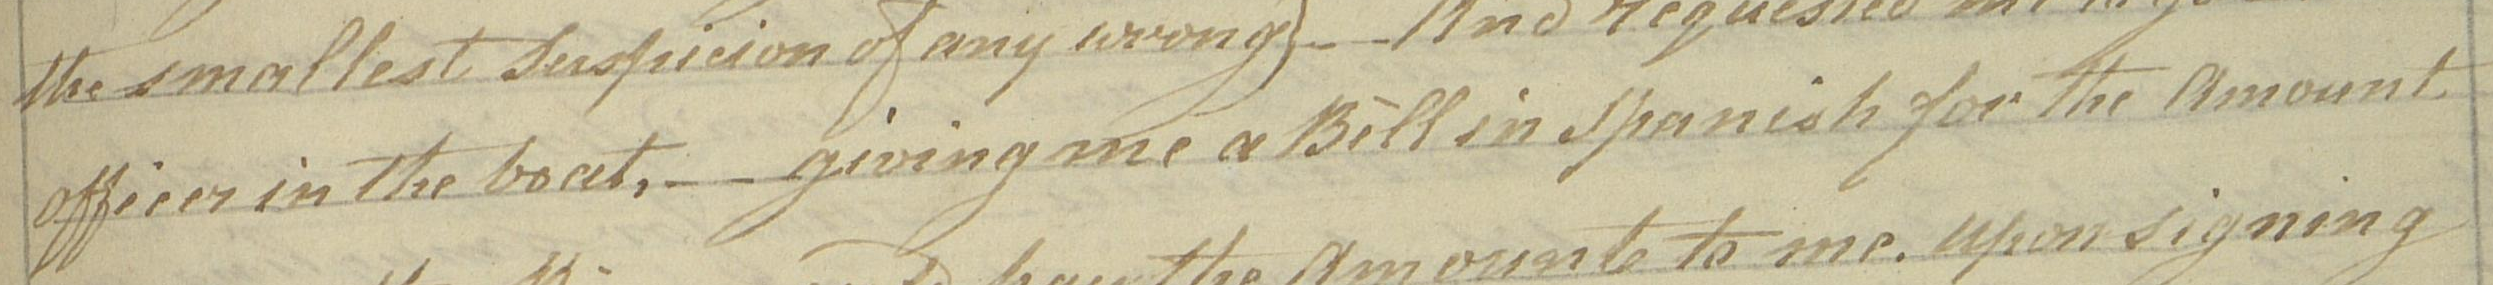Officer in the boat, giving me a Bill in Spanish for the amount
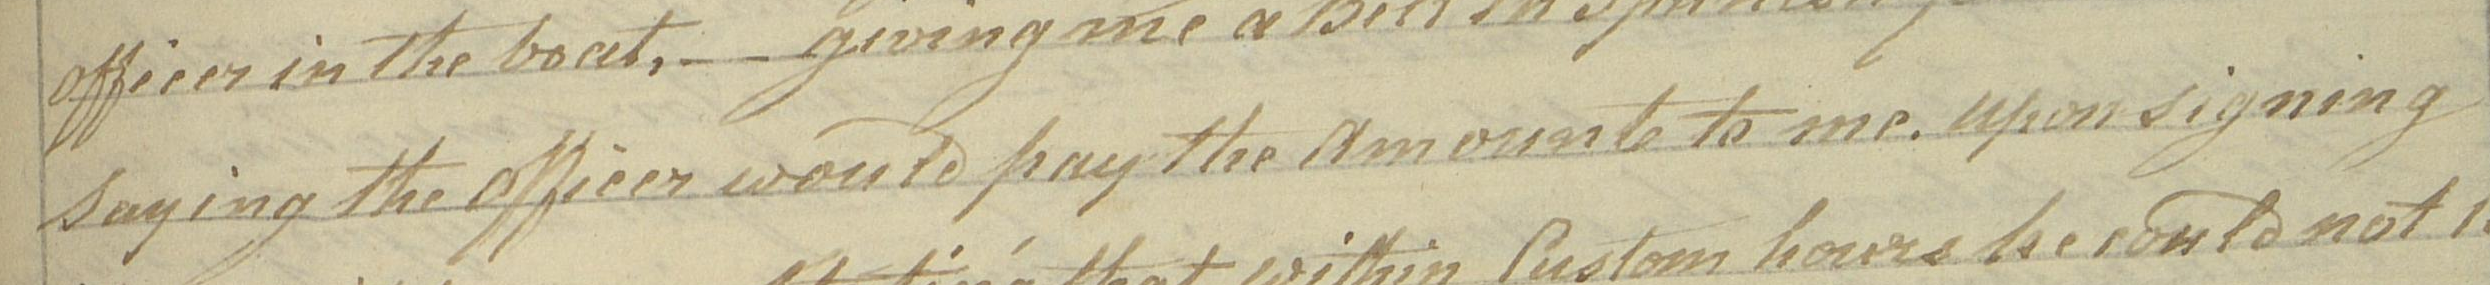saying the officer would pay the Amount to me. Upon signing
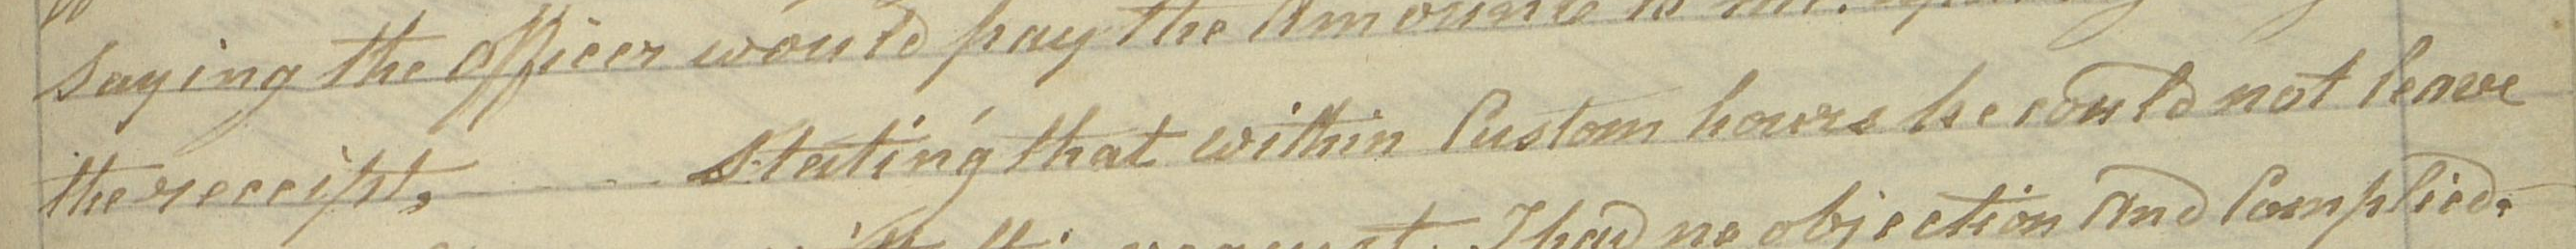the receipt. Stating that within Custom hours he would not leave
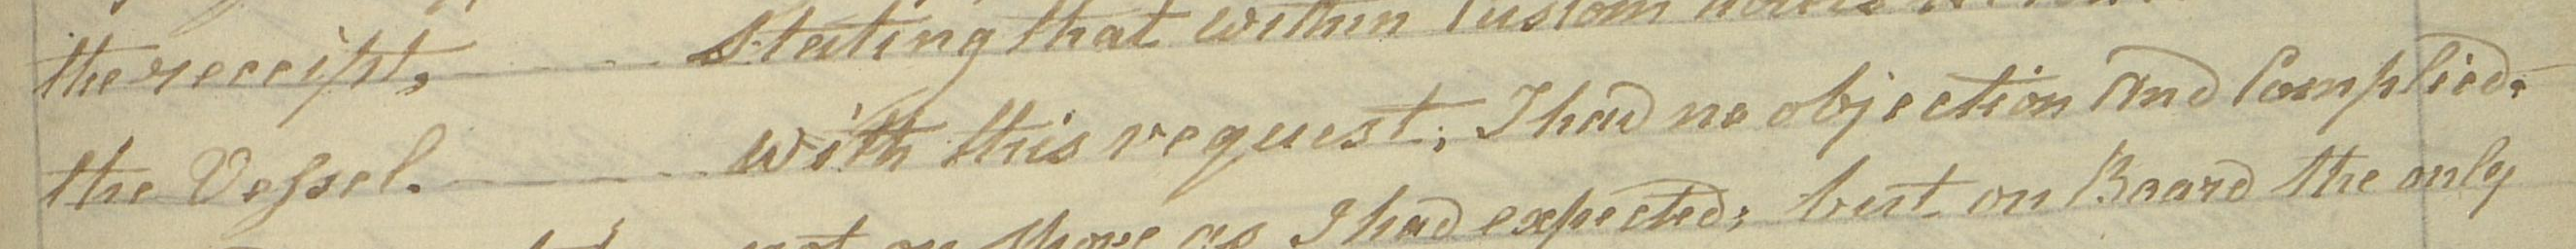the Vessel. With this request, I had no objection and Complied,
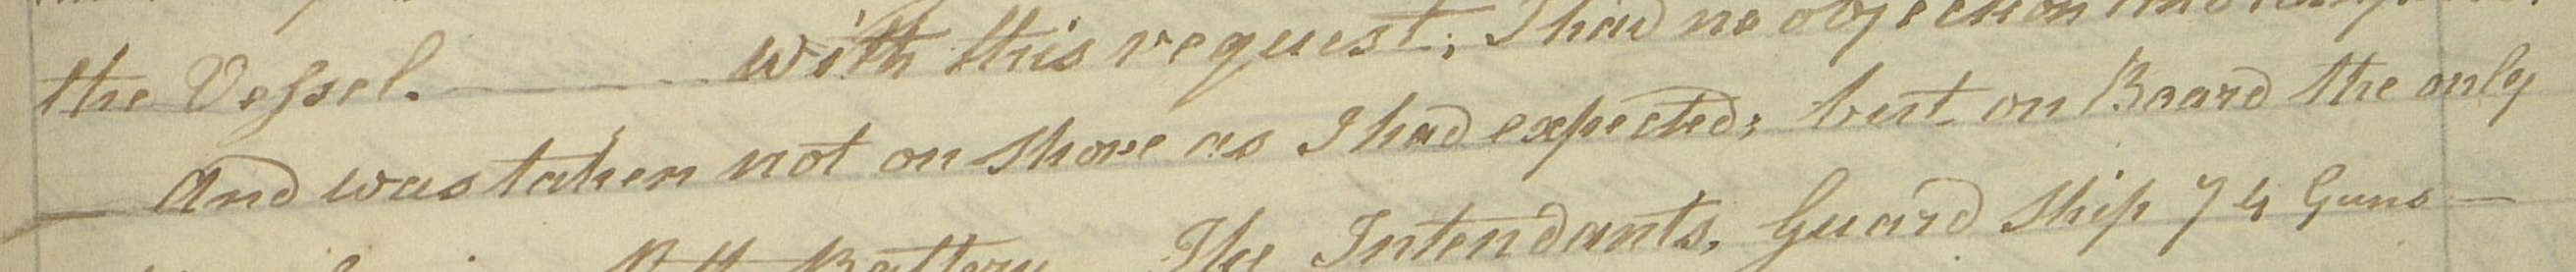And was taken not on shore as I had expected, but on Board the only
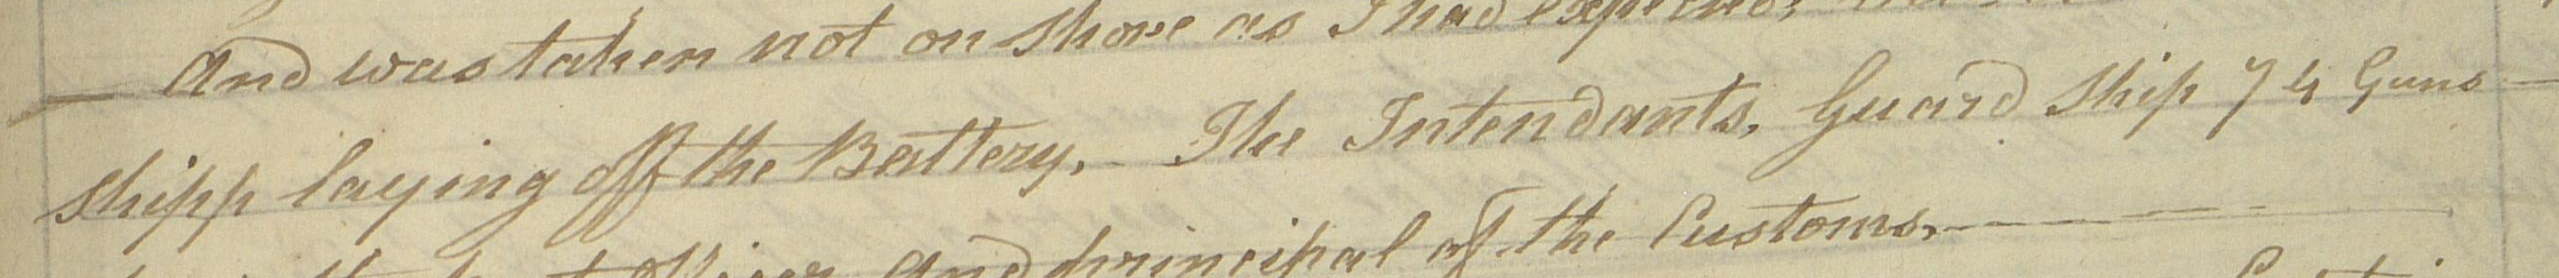Shipp laying off the Battery. The Intendants Guard Ship 74 Guns
